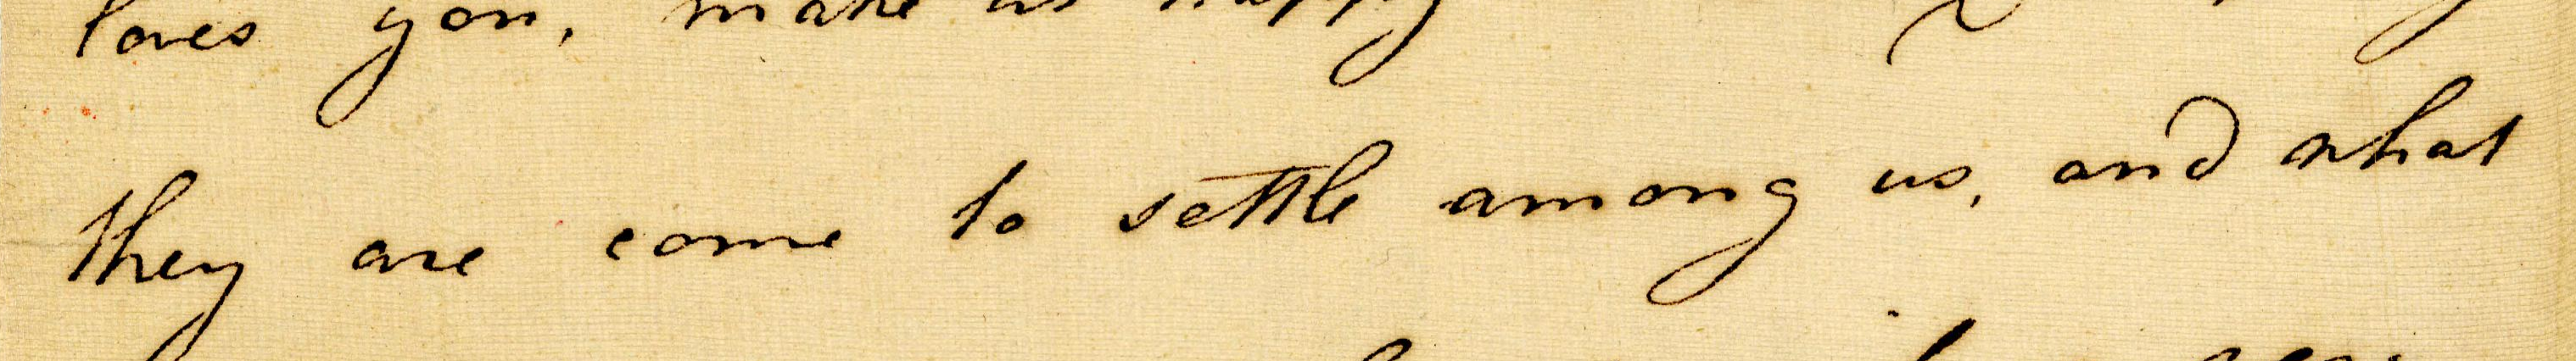they are come to settle among us, and what
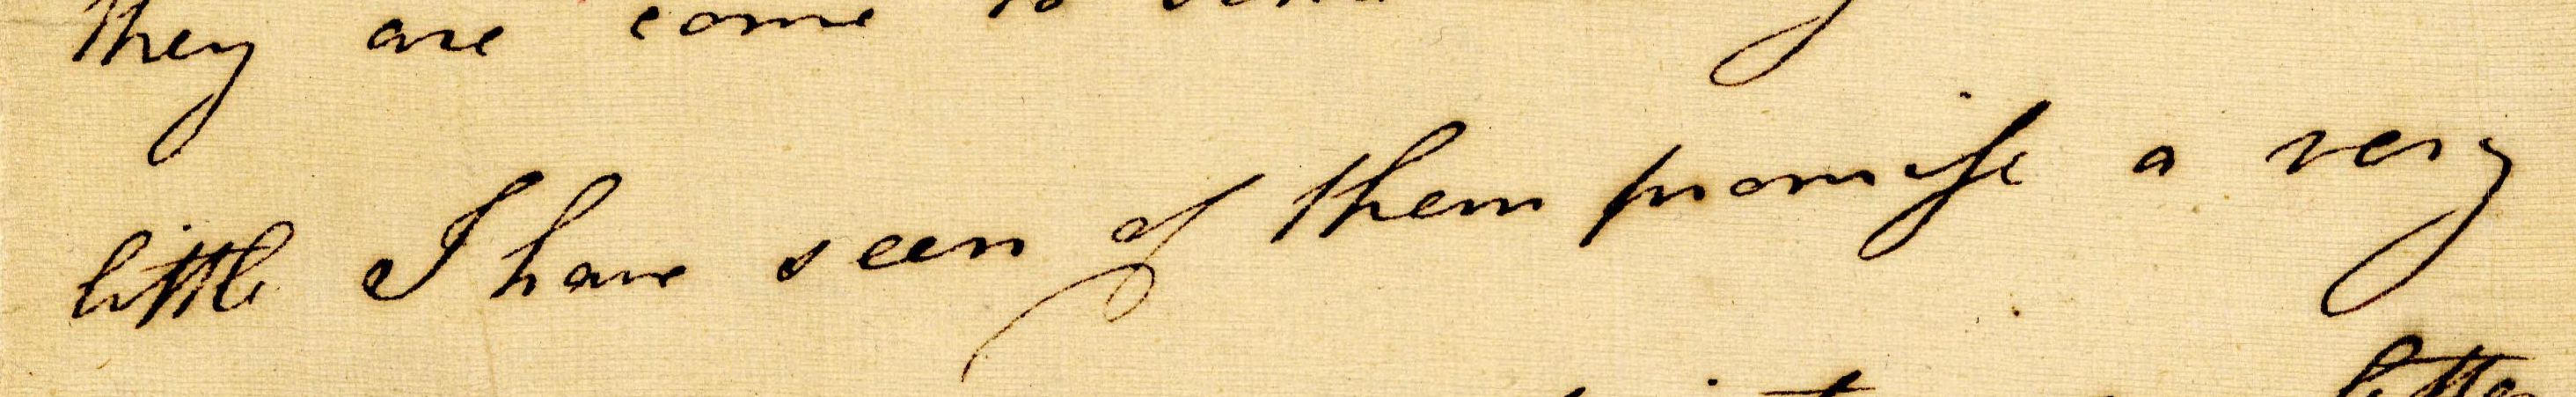little I have seen of them promise a very
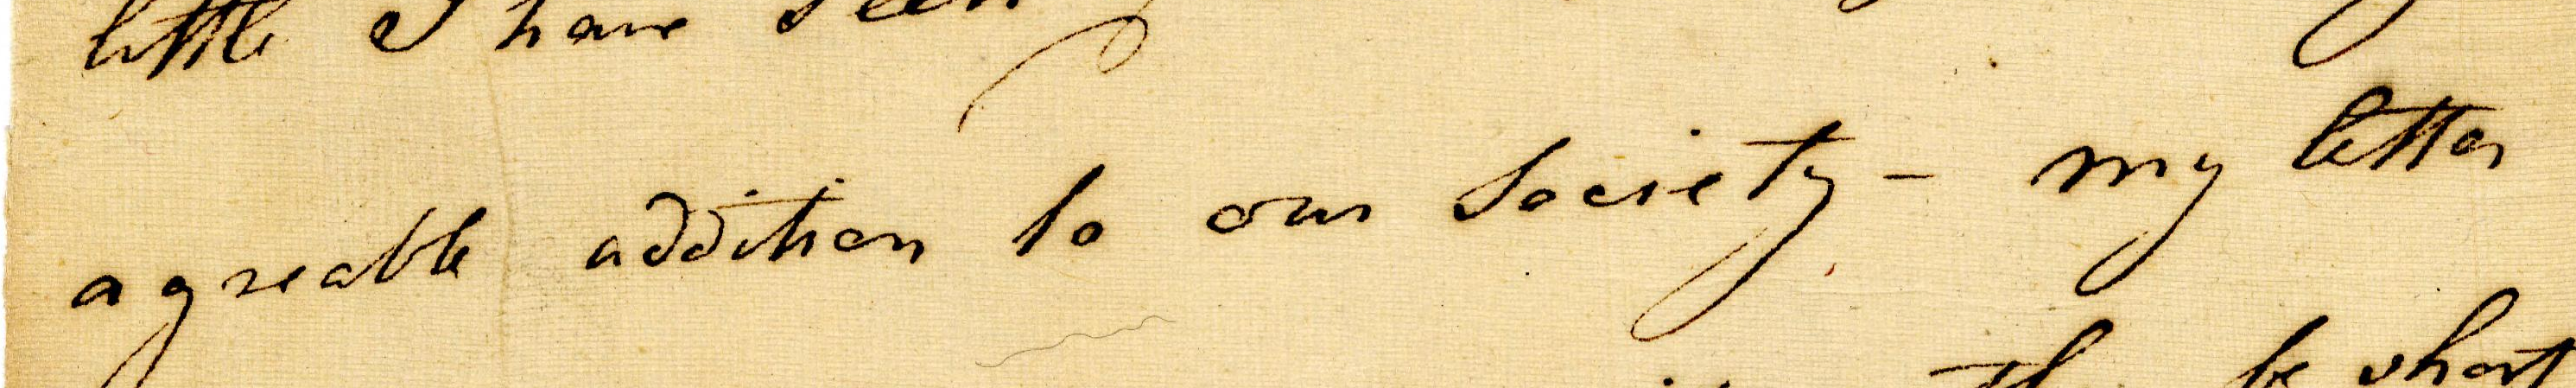agreable addition to our society- my letter
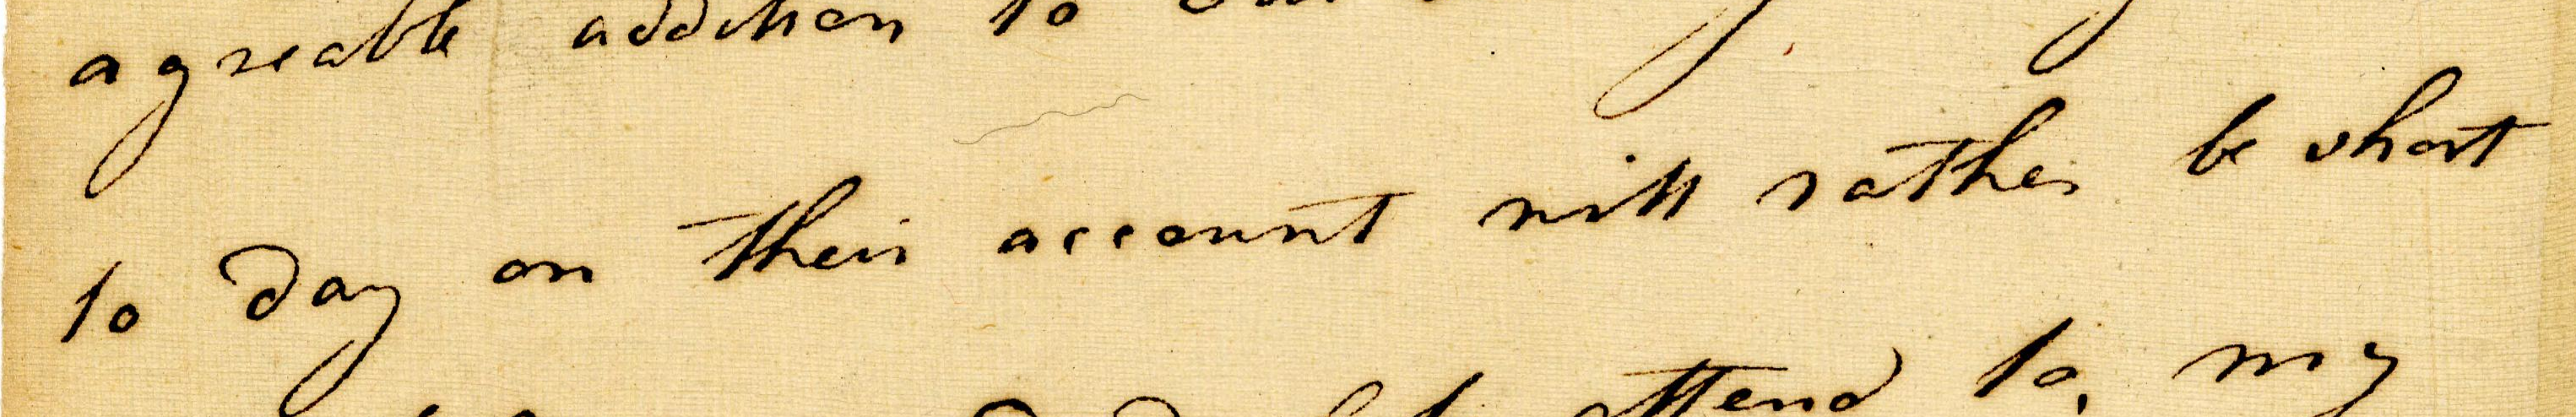to day on their account with rather be short
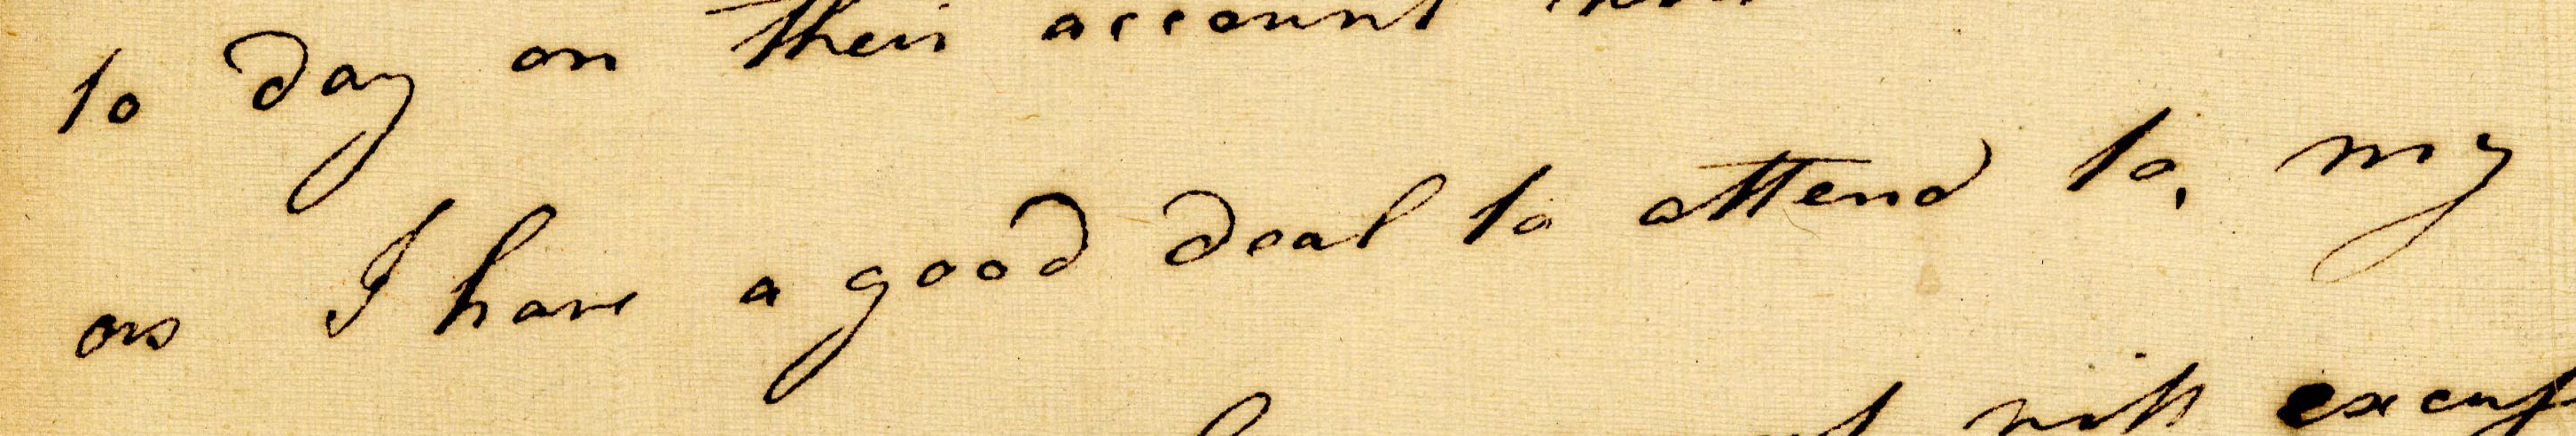on I have a good deal to attend to, my
